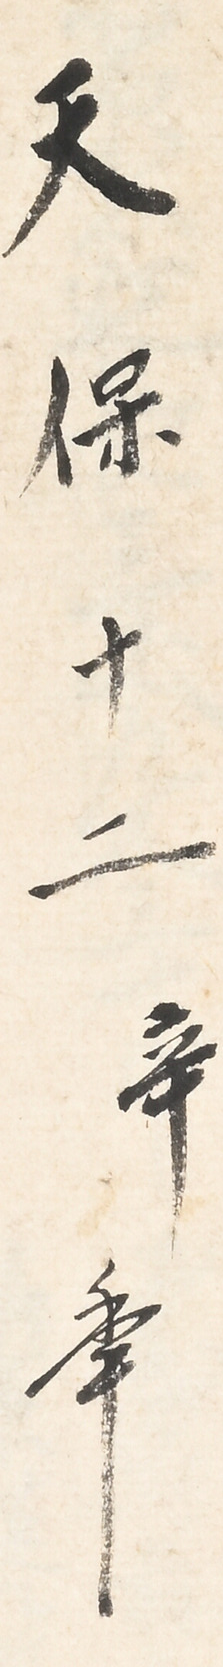天保十二辛年
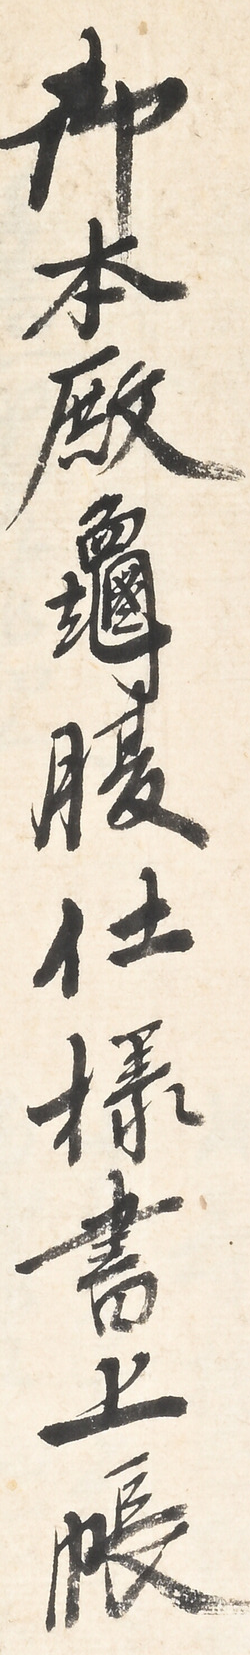御本殿亀腹仕様書上帳
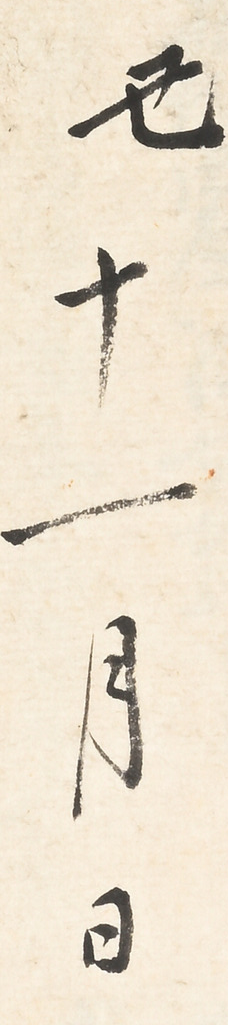丑十一月日

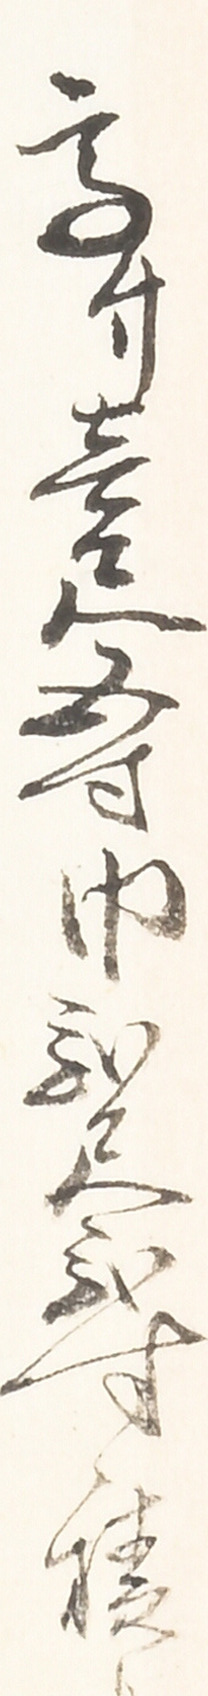高寸壱尺五寸巾弐尺弐寸積り
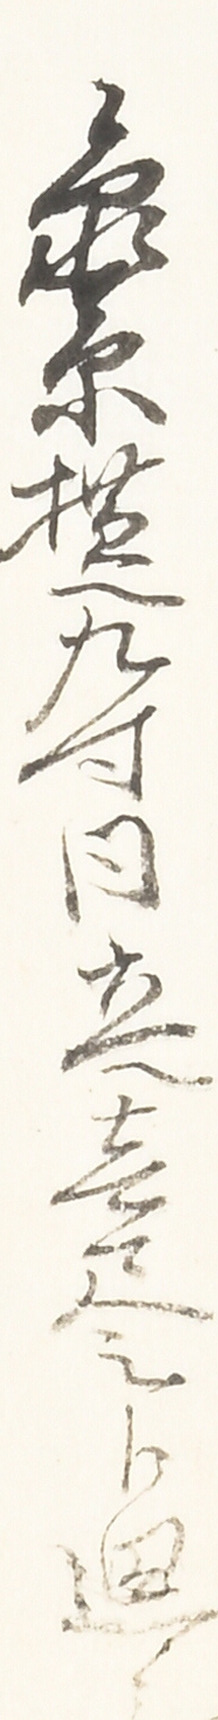亀原横へ九寸同立へ壱尺之江廻し
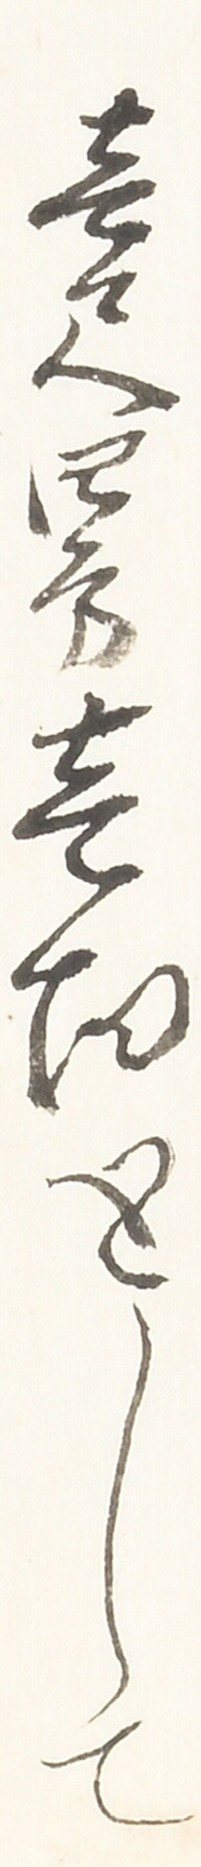壱尺四方壱切として
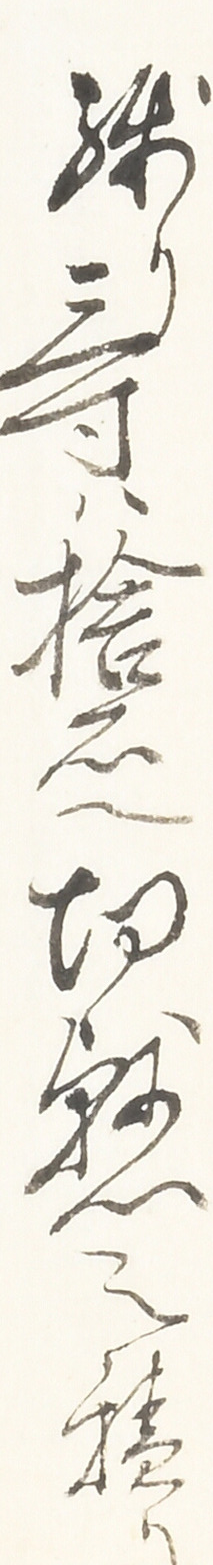殊り三寸は捨石へ切懸之積り

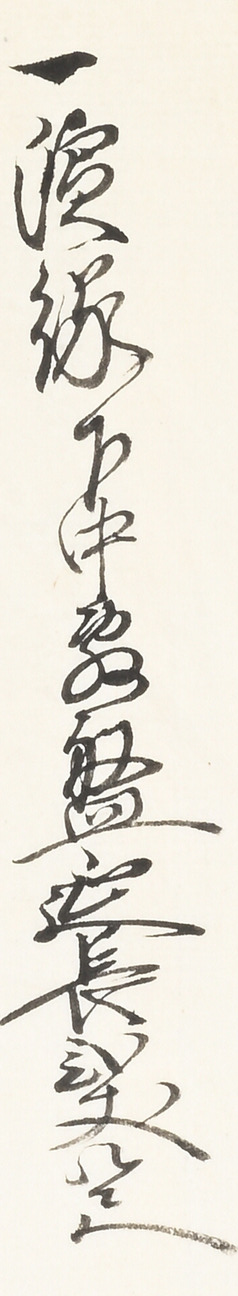一濱縁下中敷盤延長弐丈八尺
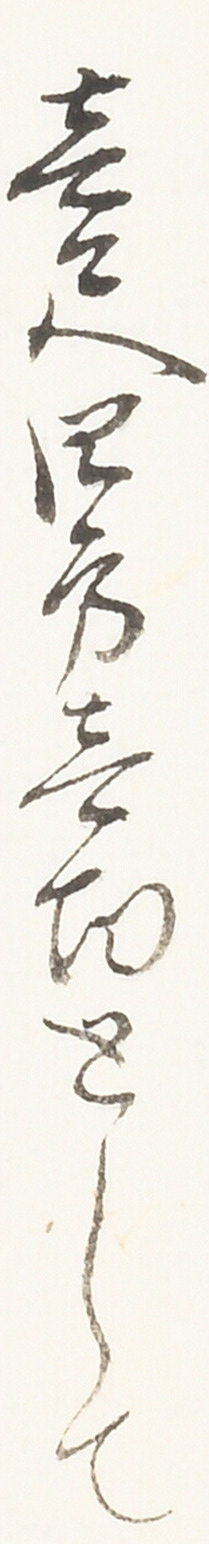壱尺四方壱切として
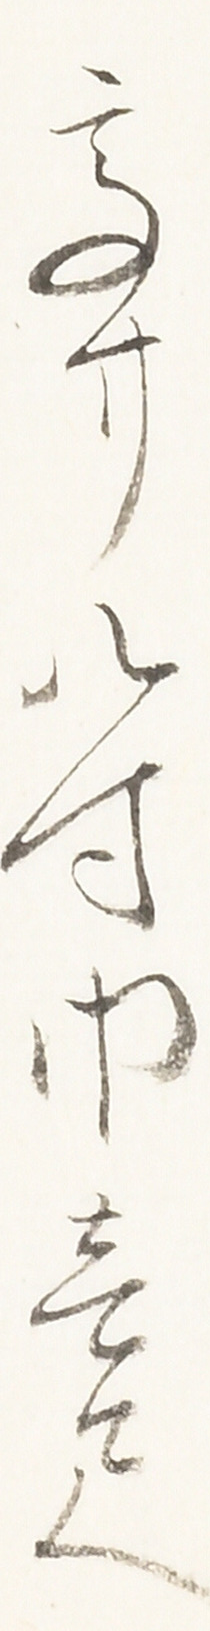高さ八寸巾壱尺
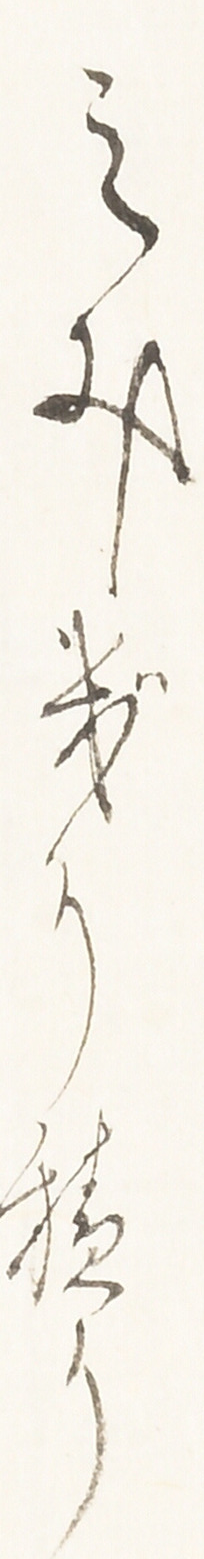之みぎり積り
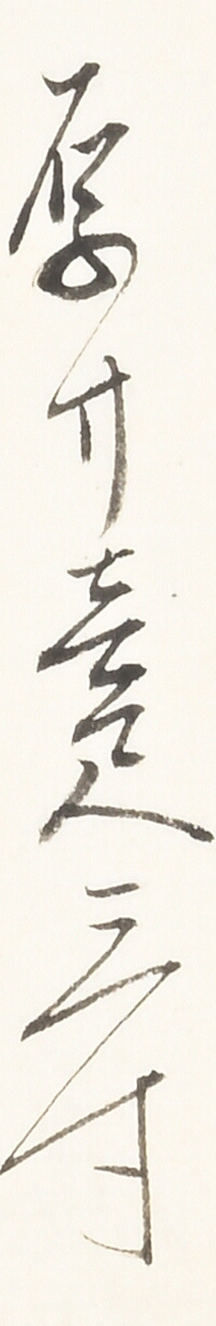厚さ壱尺三寸
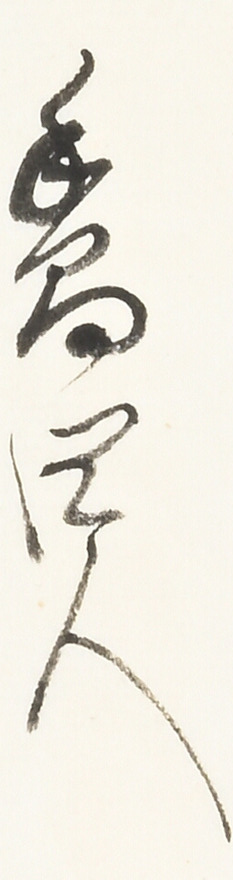手間百人
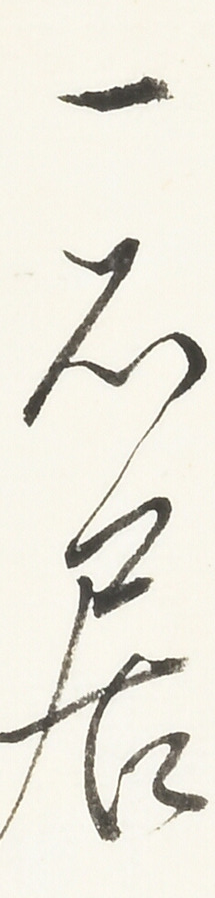一石居
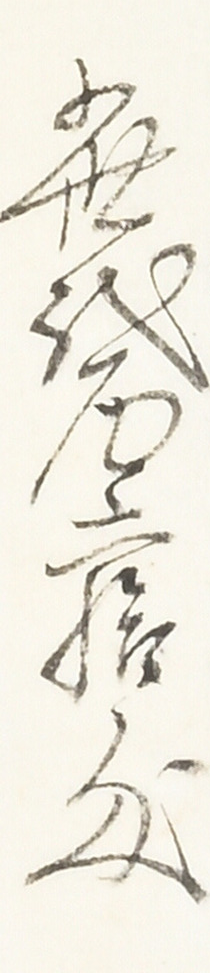此代百六拾匁
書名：天保十二辛丑年十一月日御本殿龜腹仕様書上帳
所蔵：伊那市立高遠町図書館・合同会社AMANE
